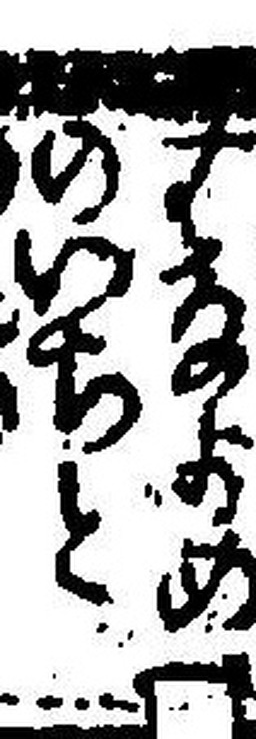のいちと
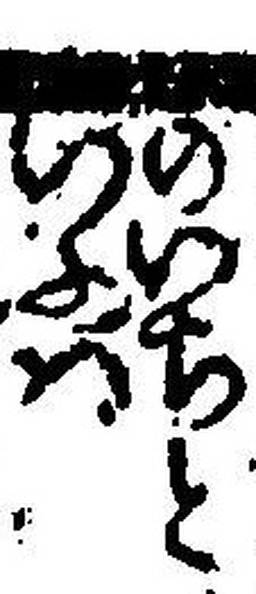いふは
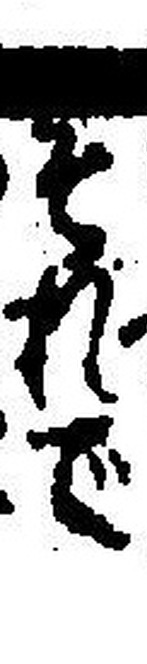それで
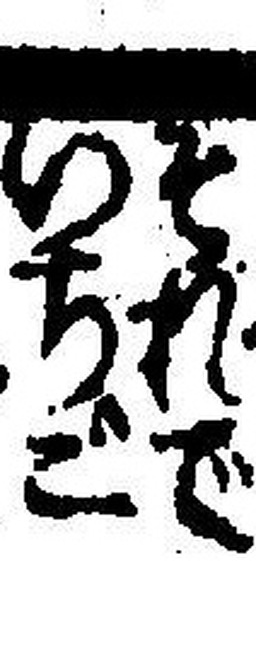いちご
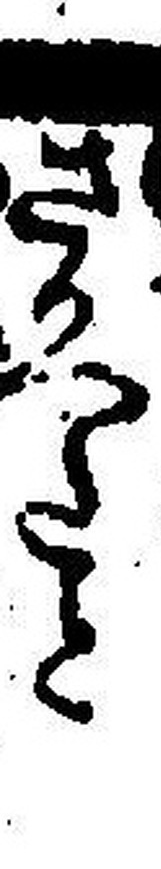さかへたと
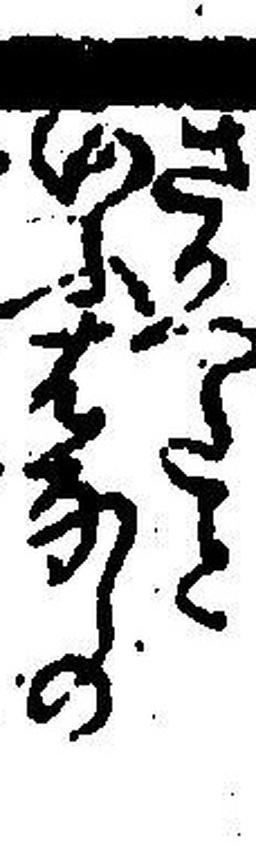いふはなしの
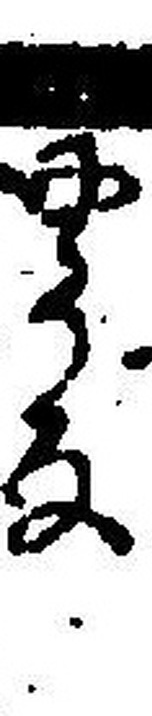やうな
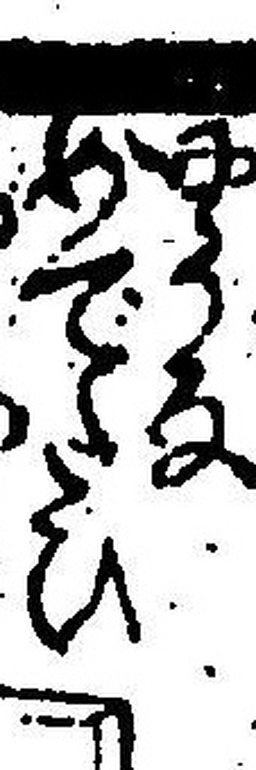めでたひ
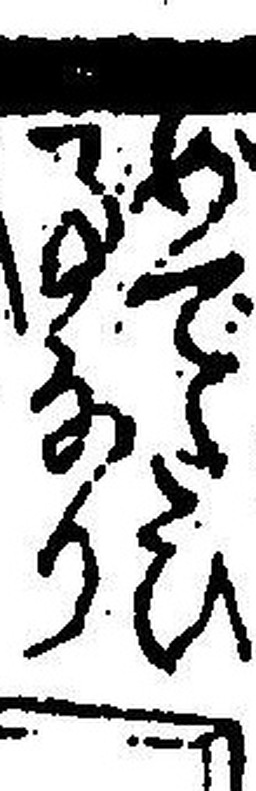事なり
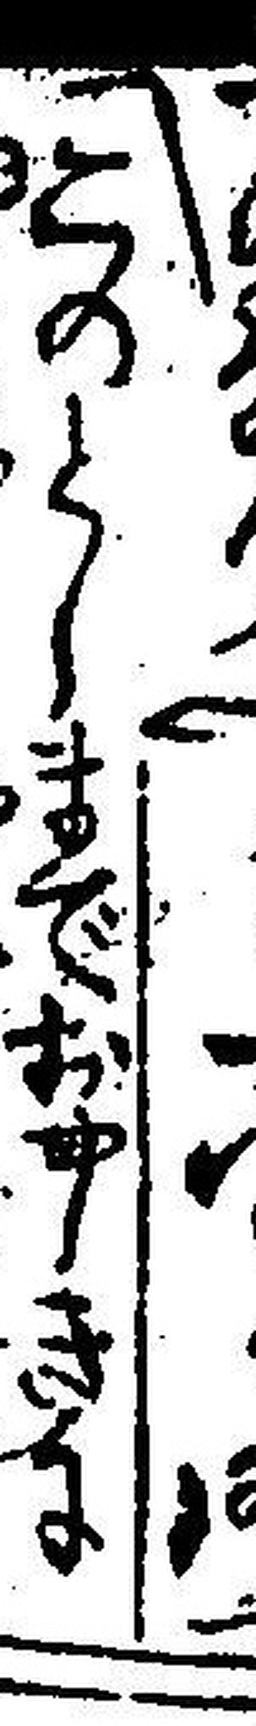〽このとしまでおやきに
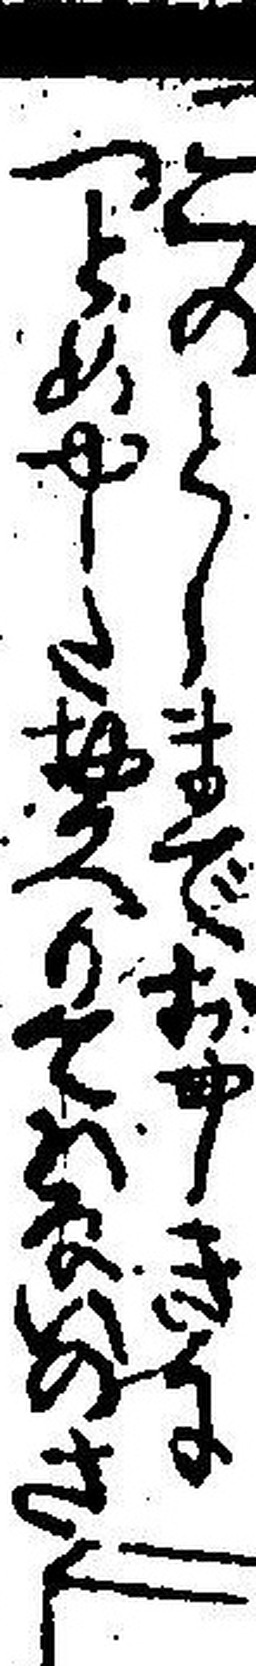つとめやしたおかへりてはないのさ

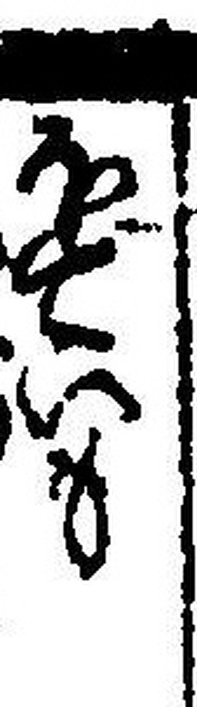ほていも
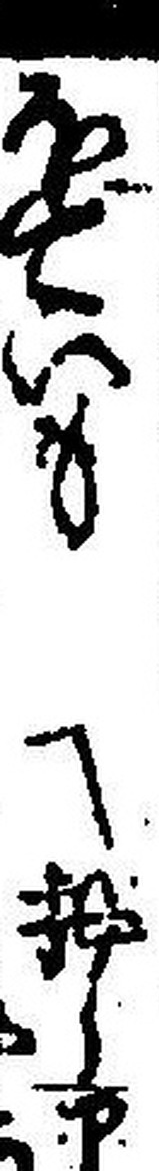ほていも
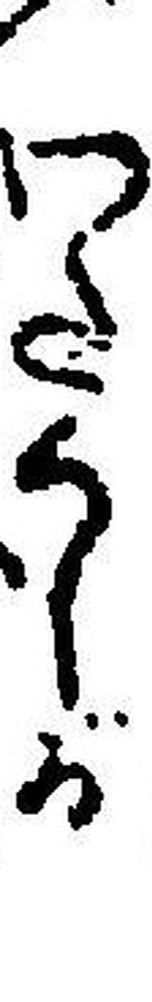わたくしが
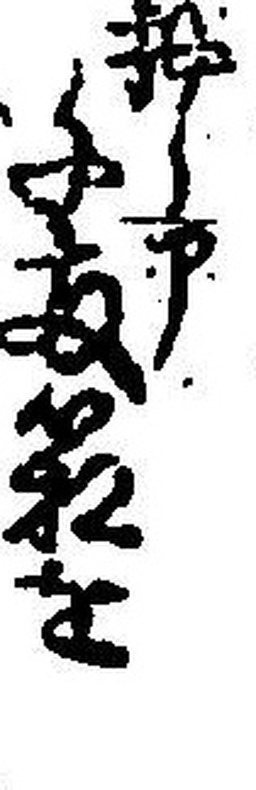千両箱を
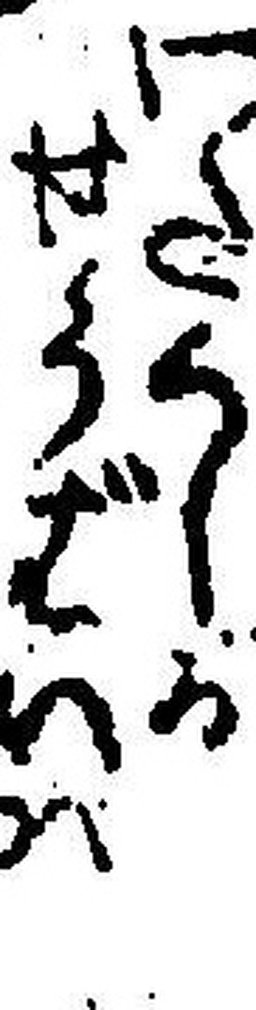せうばいは
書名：徳若水縁起金性 / 樹下石上作
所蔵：東京大学総合図書館 General Library in the University of Tokyo, JAPAN
